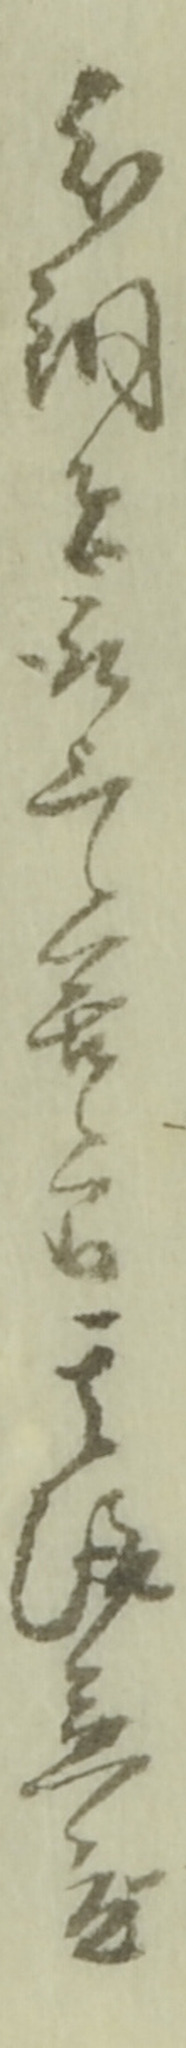分銅者取上候筈候間其趣急度

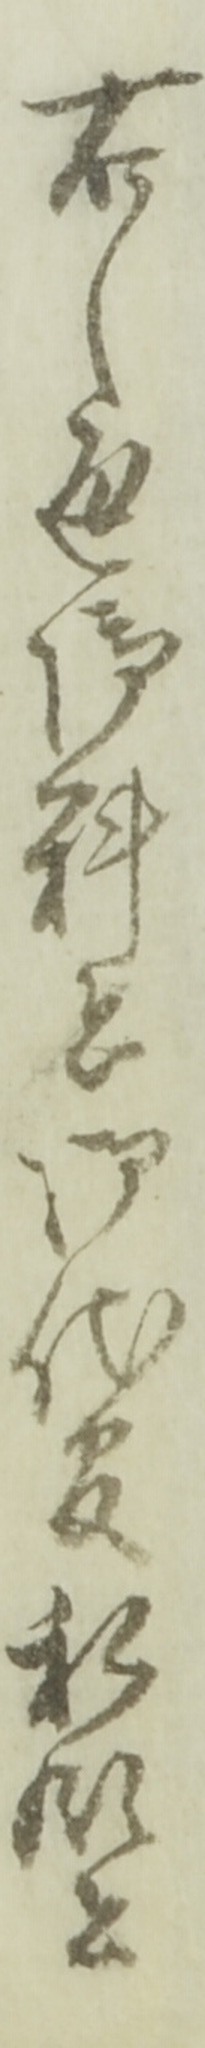右之通御料者御代官私領者
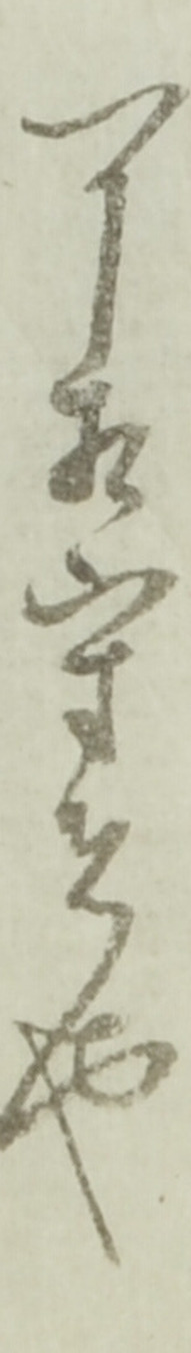可相守者也
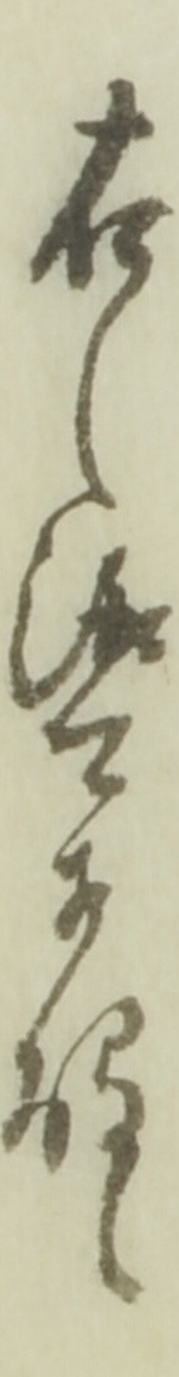右之趣可相触候
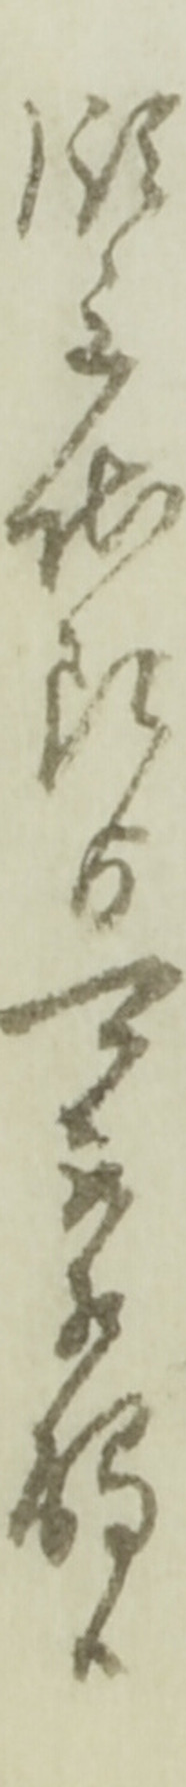領主地頭より可被相触候
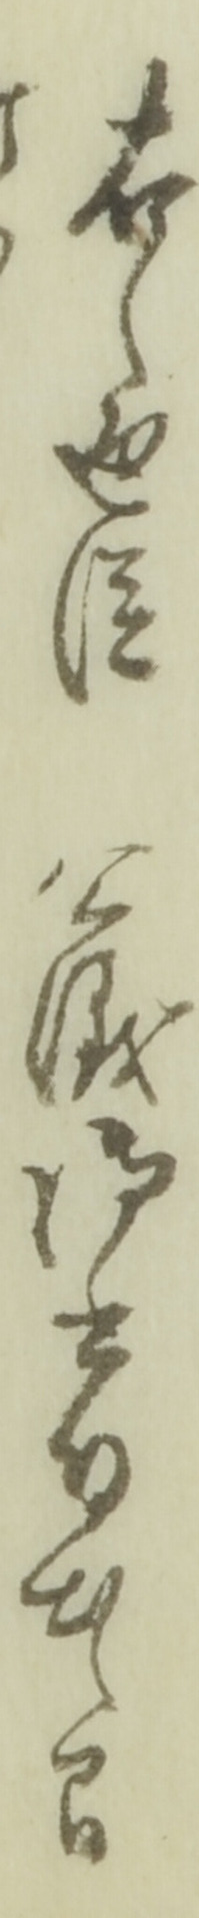右之通従公儀御書付出候間
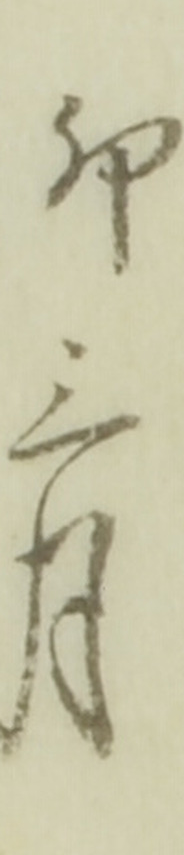卯三月
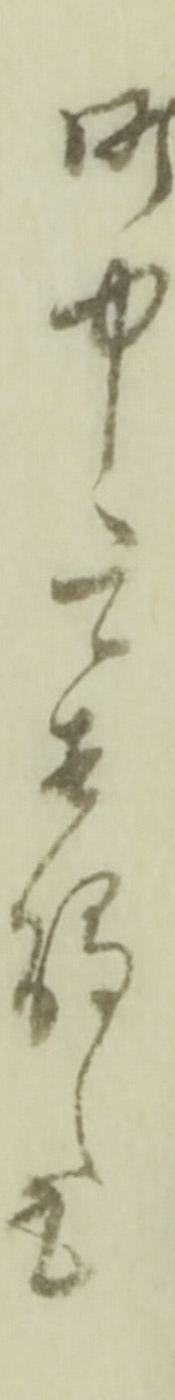町中へ可相触候以上
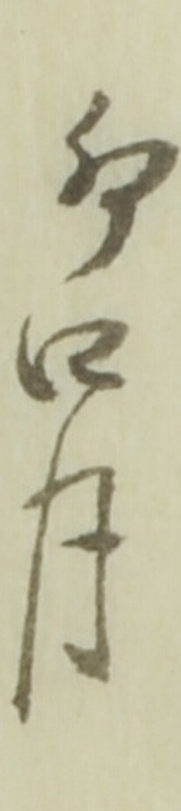卯四月
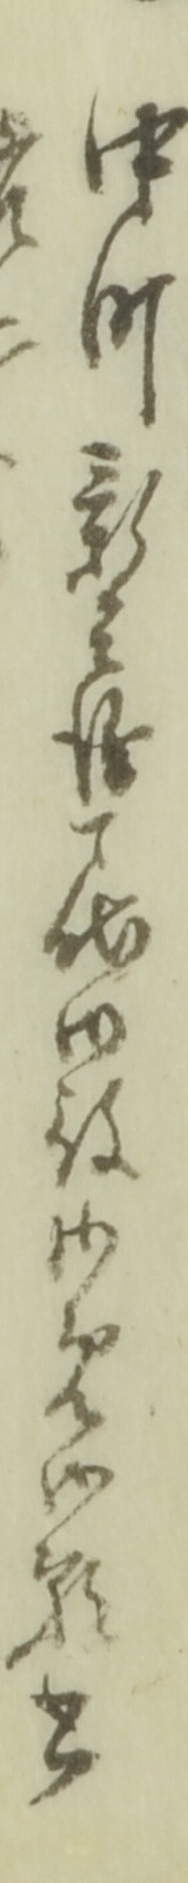一中町新兵衛丁代御役御免御願書
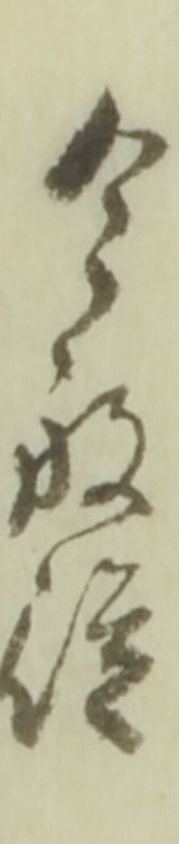今般従
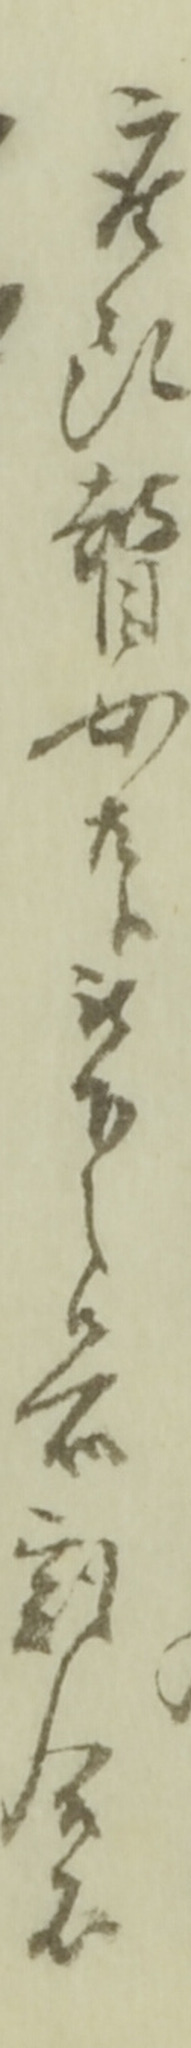座頭瞽女共ヘ被下候所割合不
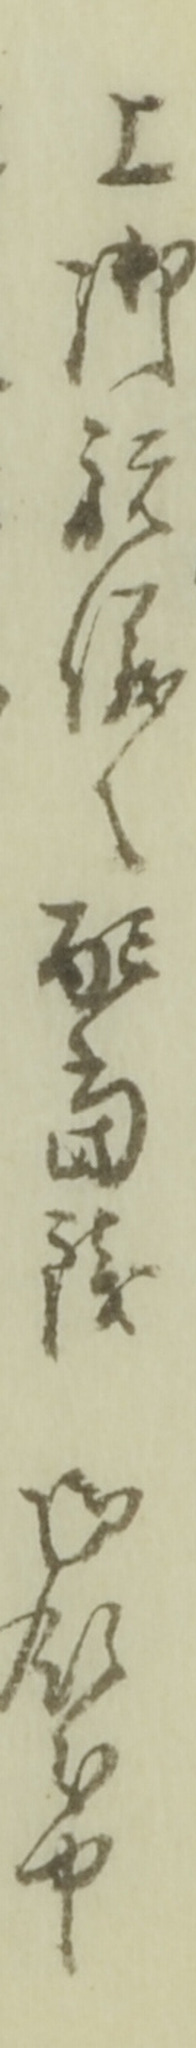上御祝儀之配当銭御領分中
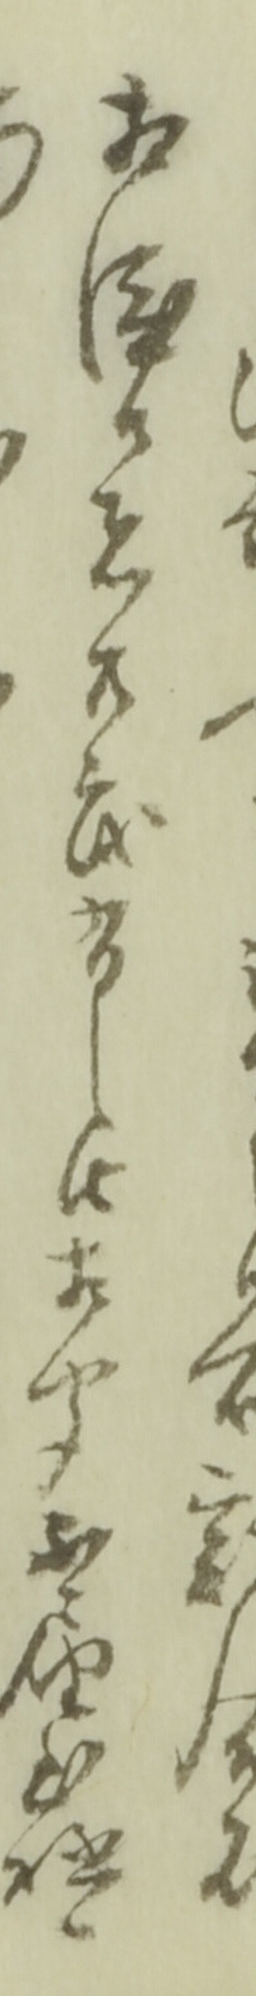相渡候者共茂有之由相聞不届至極二
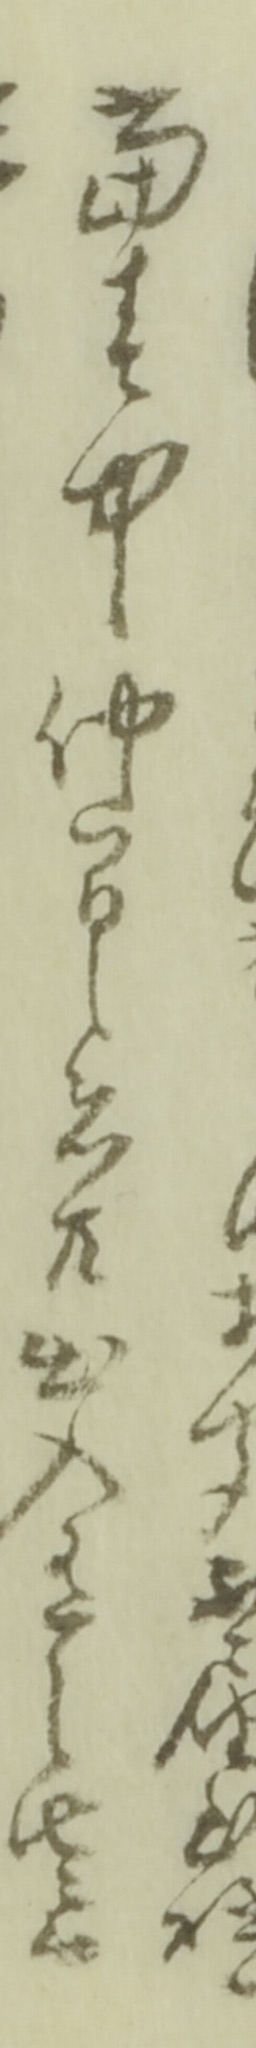当春中仲間之者共出入有之由二而
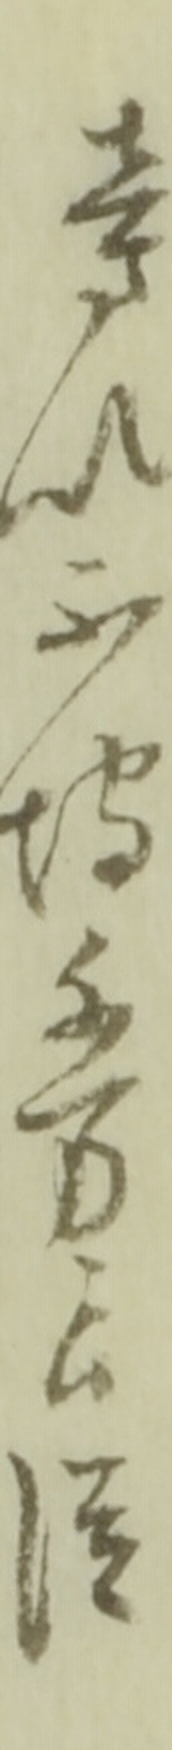寺社不傳千万二候従
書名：御公儀様御領主様御触書控
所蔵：伊那市立高遠町図書館・合同会社AMANE
